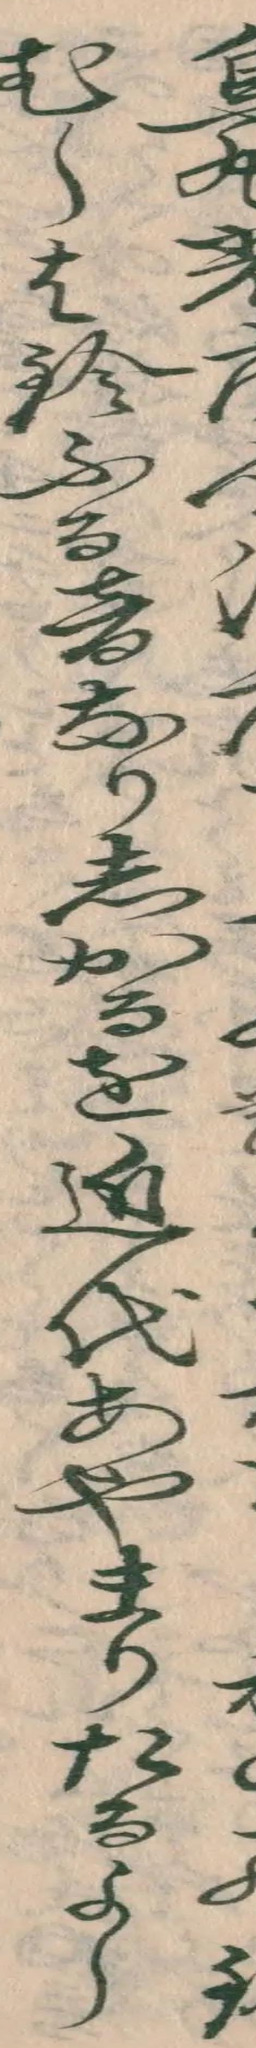むしは鈴ふる音なりしかるを近代あやまりたるよし
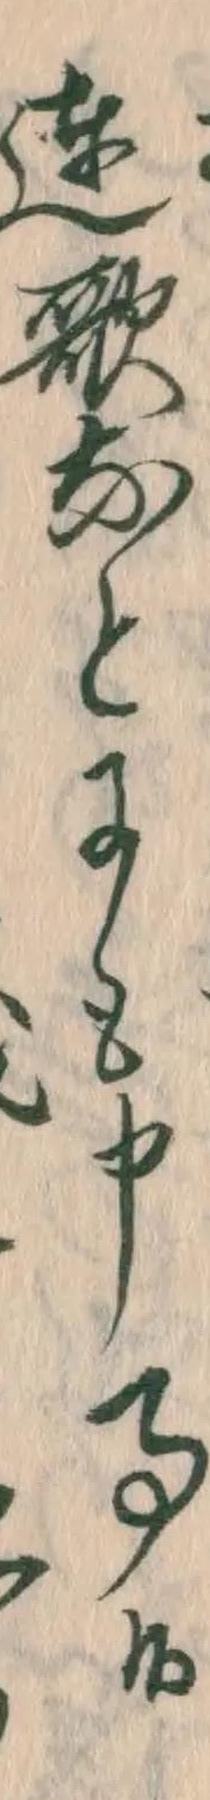連歌なとにも申事候
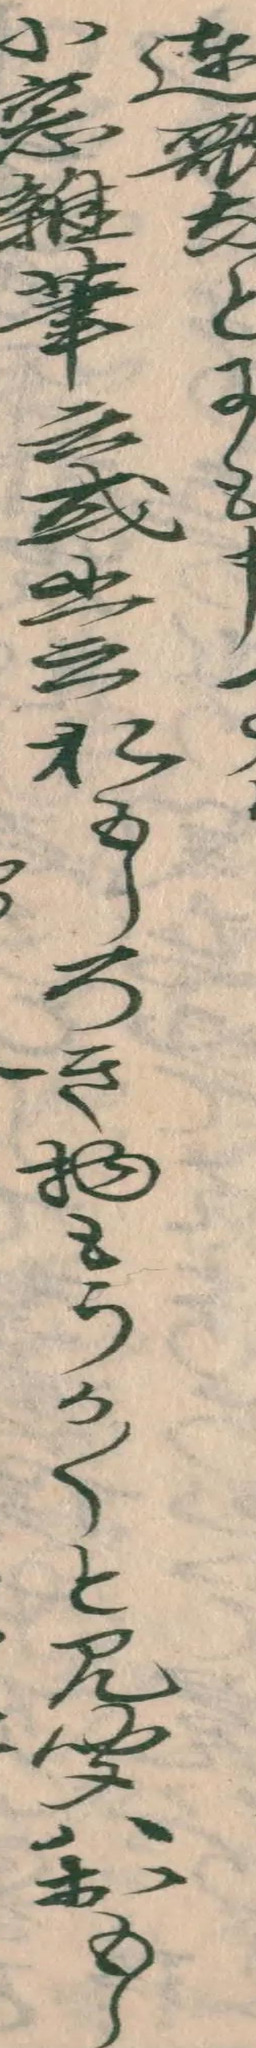小窓雑筆云或書云おもしろき物もうか〱と見聞はおもし
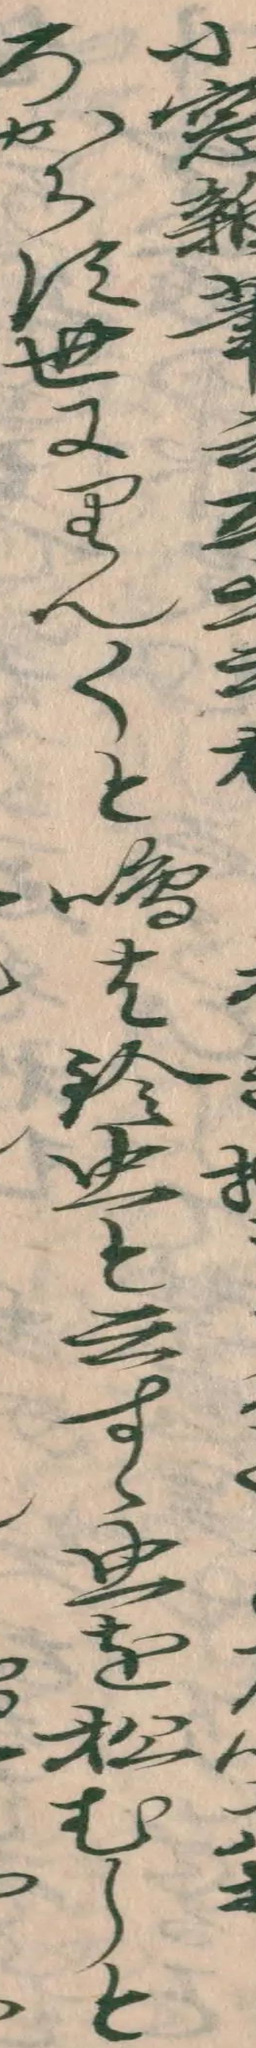ろからす世にりん〱と鳴は鈴虫と云すゝ虫を松むしと
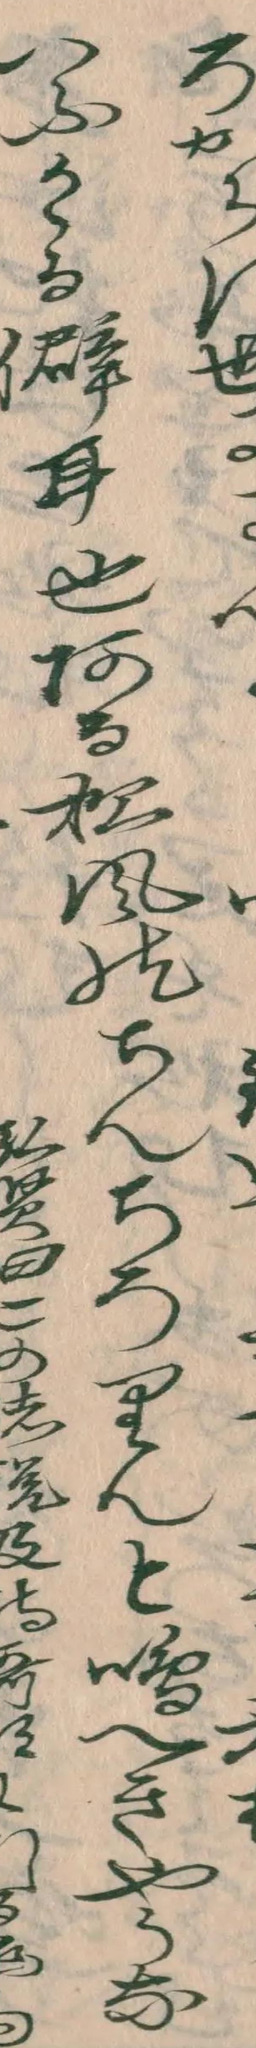いふかゝる僻耳也ある松風のちんちろりんと鳴へきような
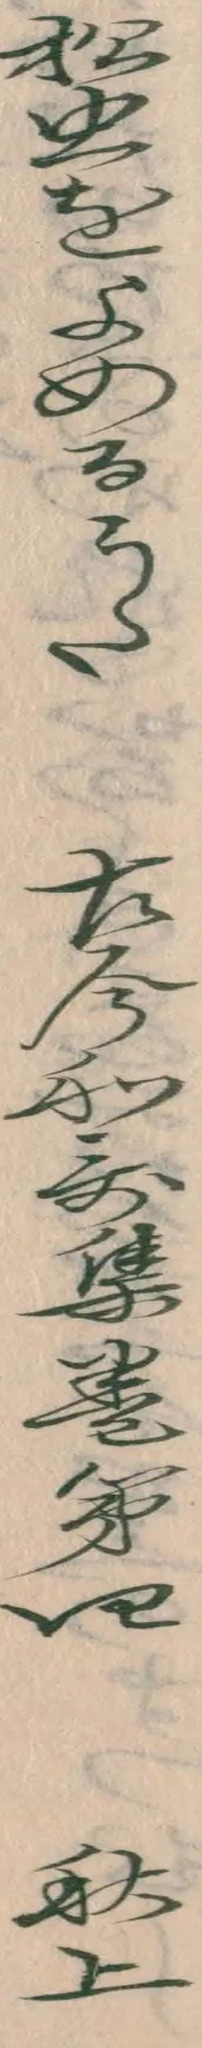松虫をよめるうた古今和哥集巻第四秋上
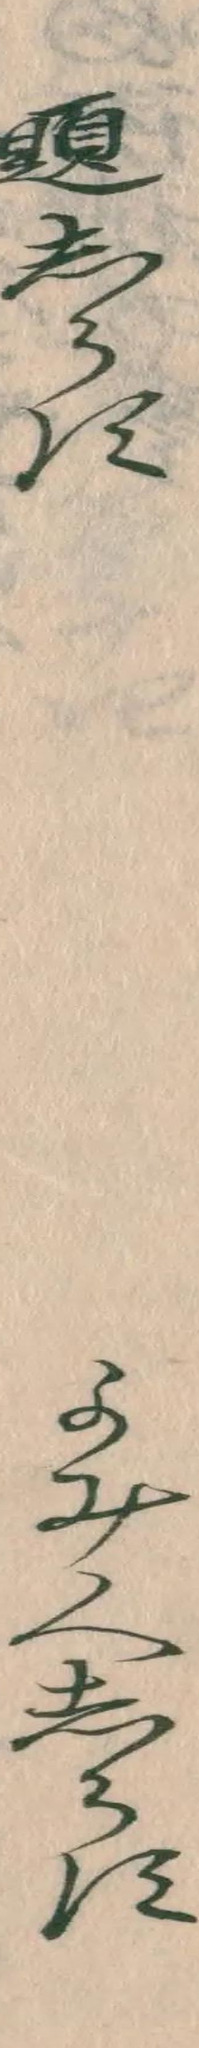題しらすよみ人しらす
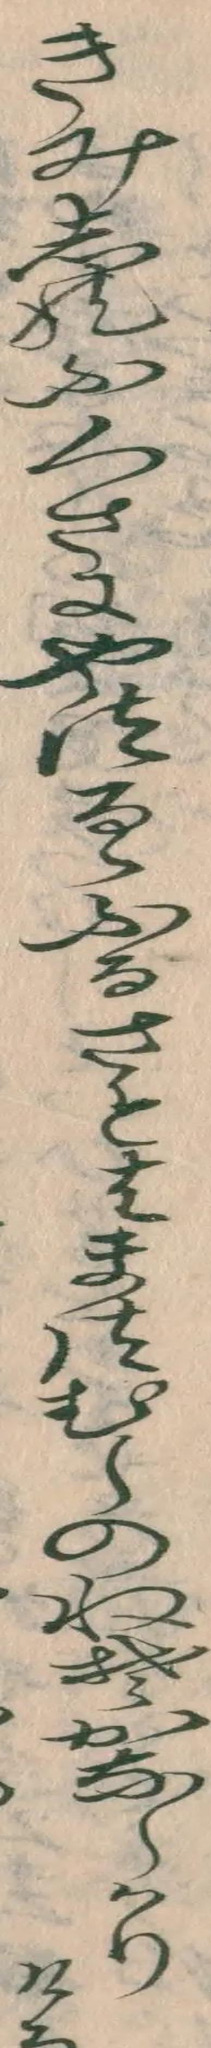きみしのふくさにやつるゝふるさとはまつむしのねそかなしかり
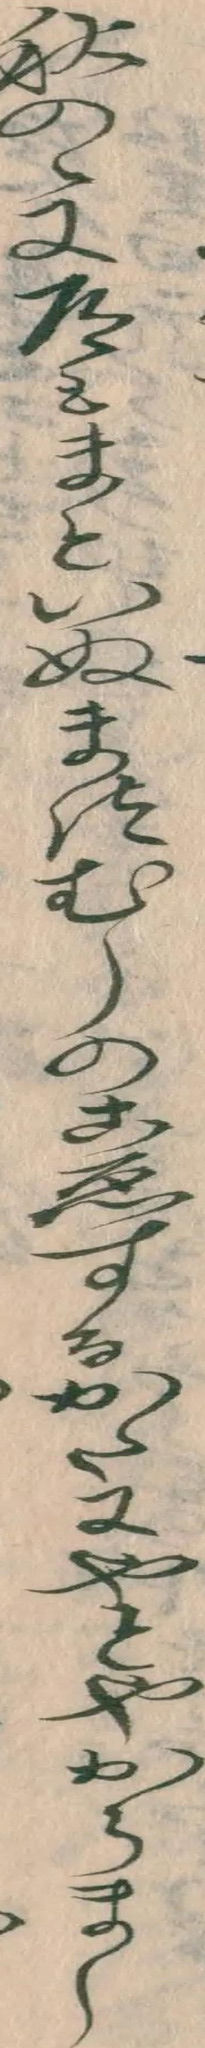秋のゝに道もまといぬまつむしのこゑするかたにやとやからまし
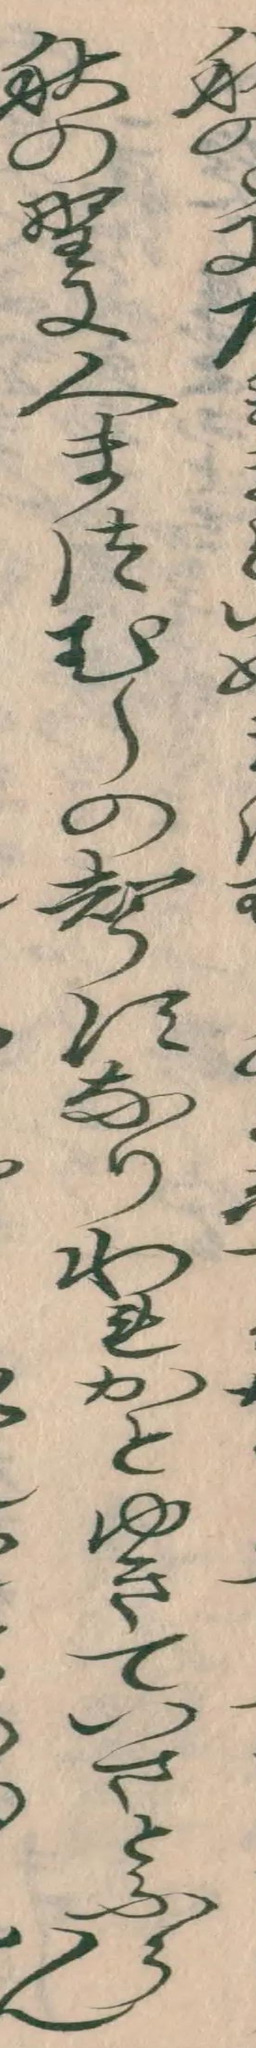秋の野に人まつむしの聲すなりわれかとゆきていさとふら
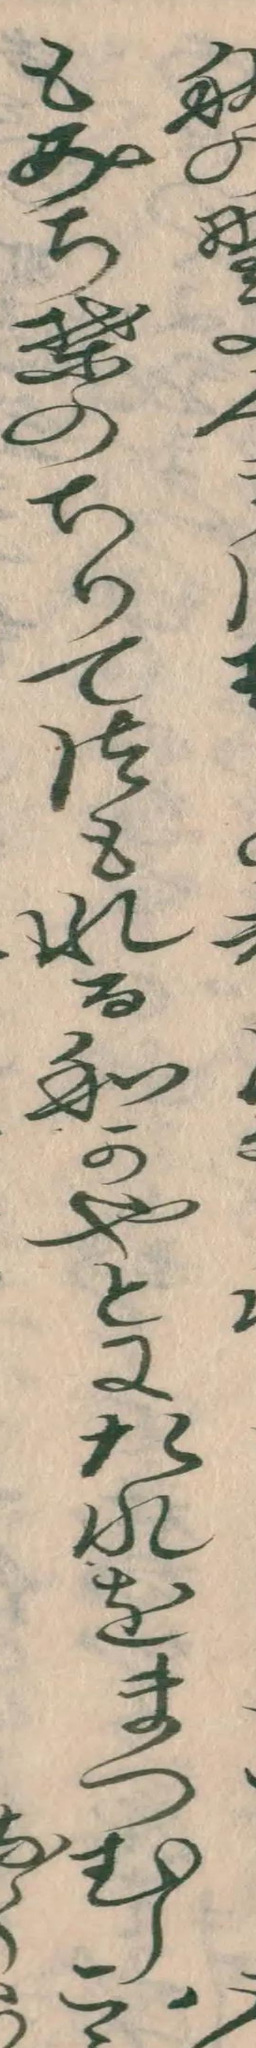もみち葉のちりてつもれるわかやとにたれをまつむしこヽら
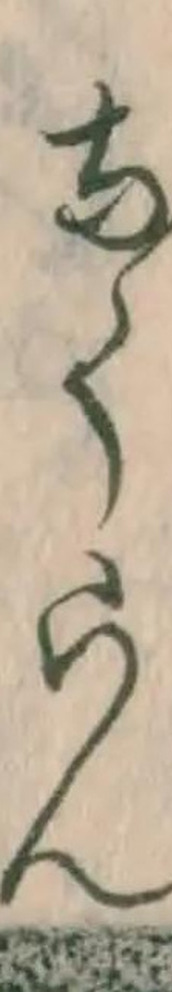なくらん
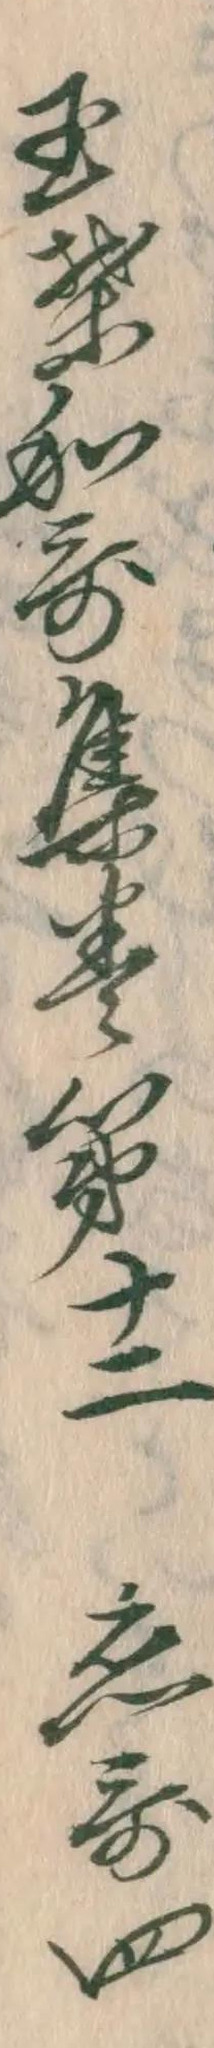玉葉和哥集巻十二恋哥四
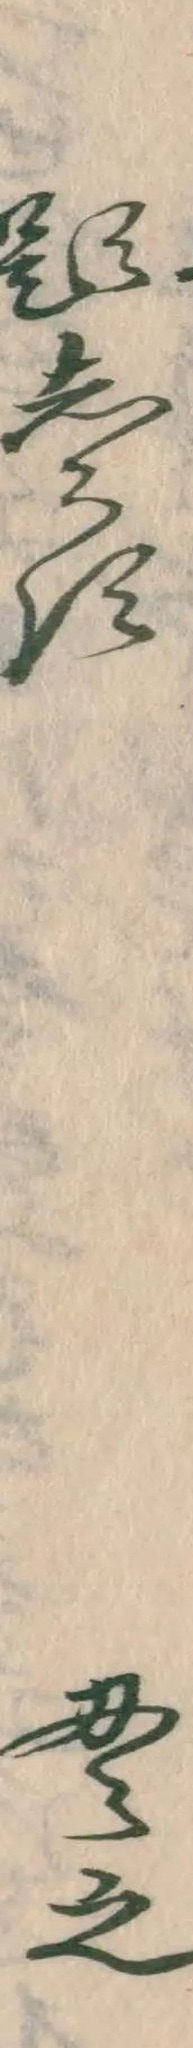題しらす貫之
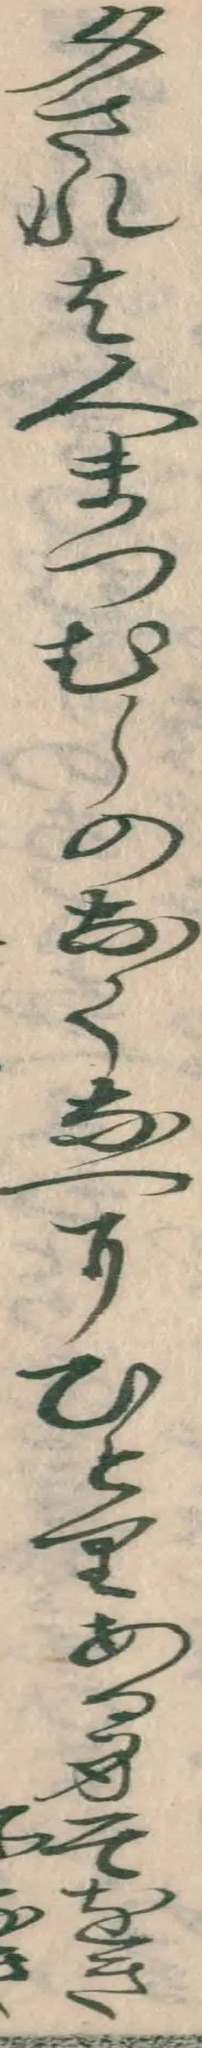夕されは人まつむしのなくなへにひとりある身そをき
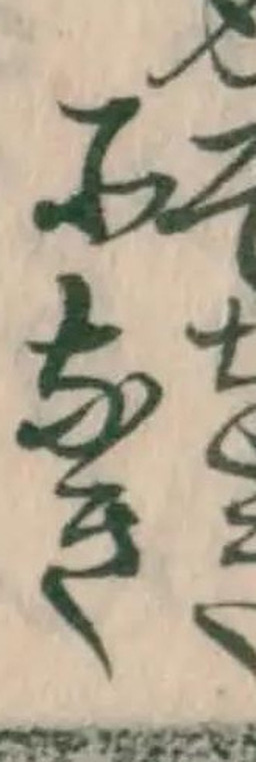所なき
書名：千蟲譜 3巻. [3]
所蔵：国立国会図書館 National Diet Library, JAPAN
